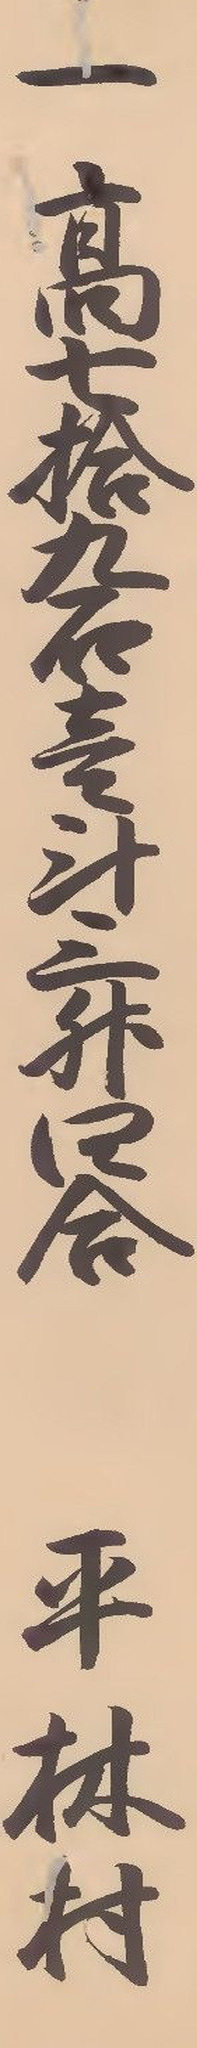一高七拾九石壱斗三升四合平林村
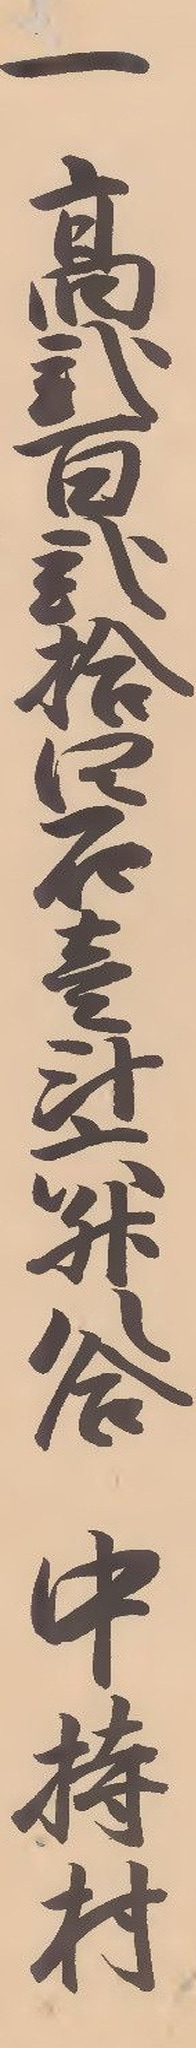一高弐百弐拾四石壱斗六升八合中持村

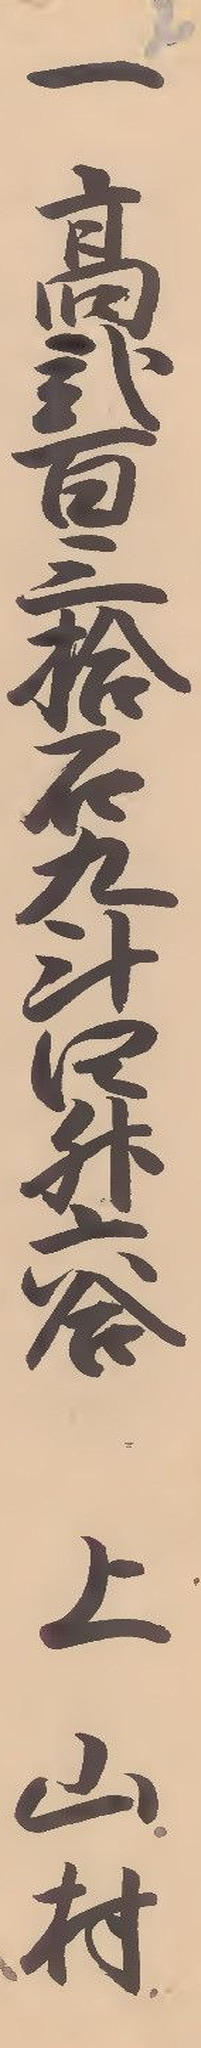一高弐百三拾石九斗四升六合上山村
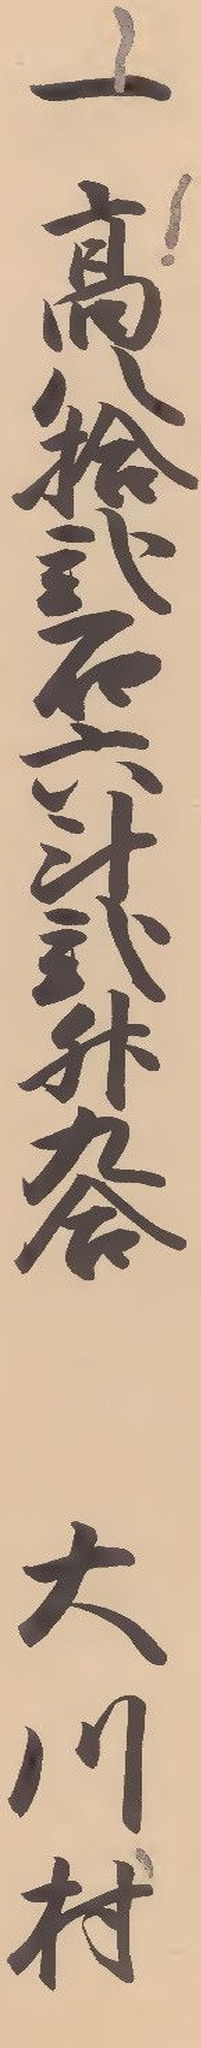一高八拾弐石六斗弐升九合大川村
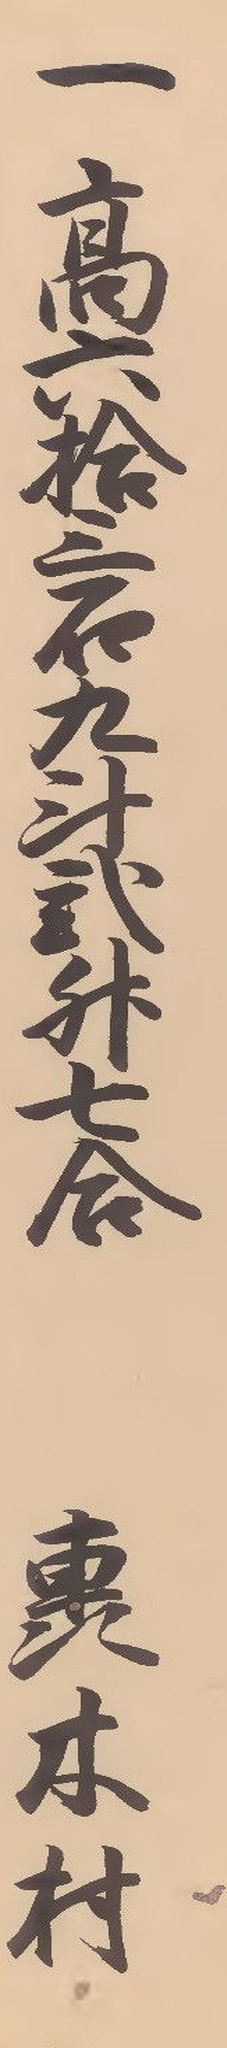一高六拾三石九斗弐升七合轟木村
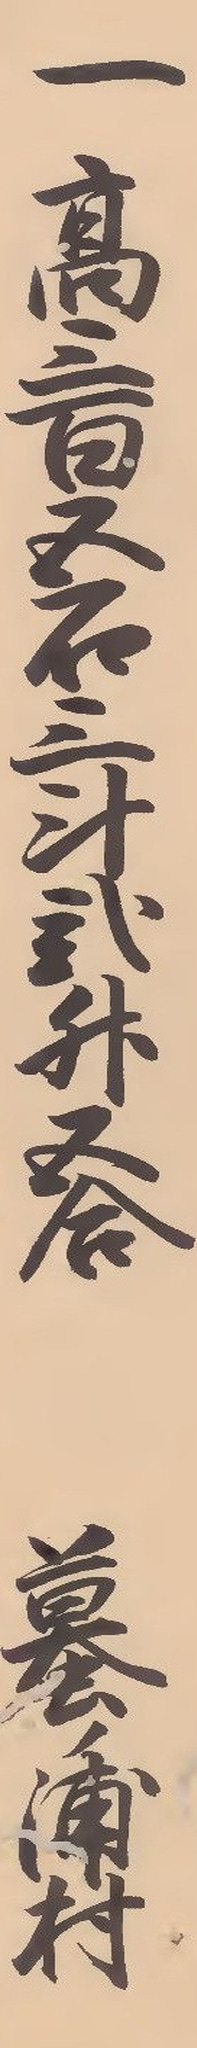一高三百五石三斗弐升五合蟇ノ浦村
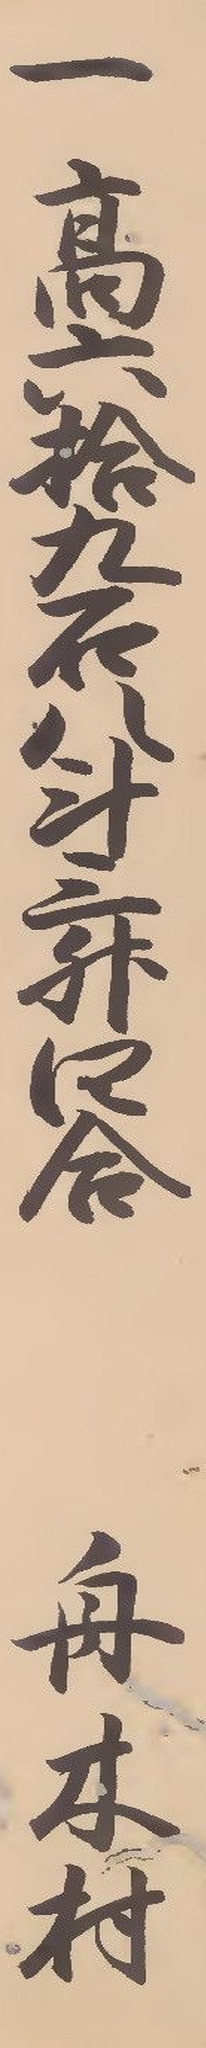一高六拾九石八斗三升四合舟木村
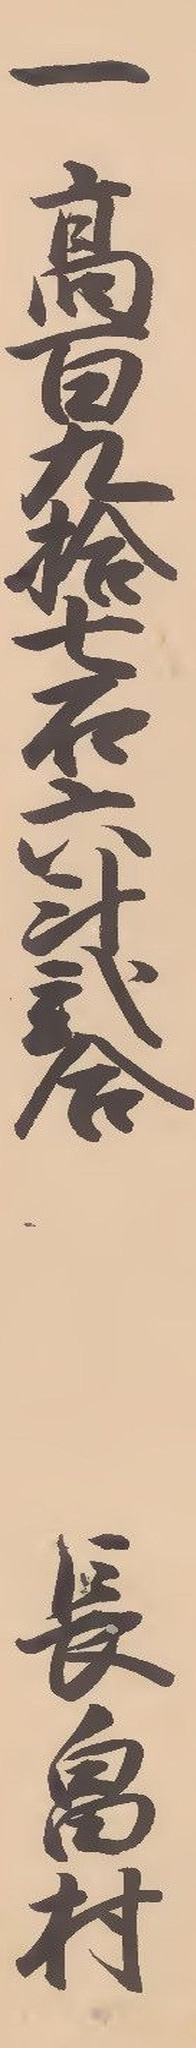一高百九拾七石六斗弐合長畠村
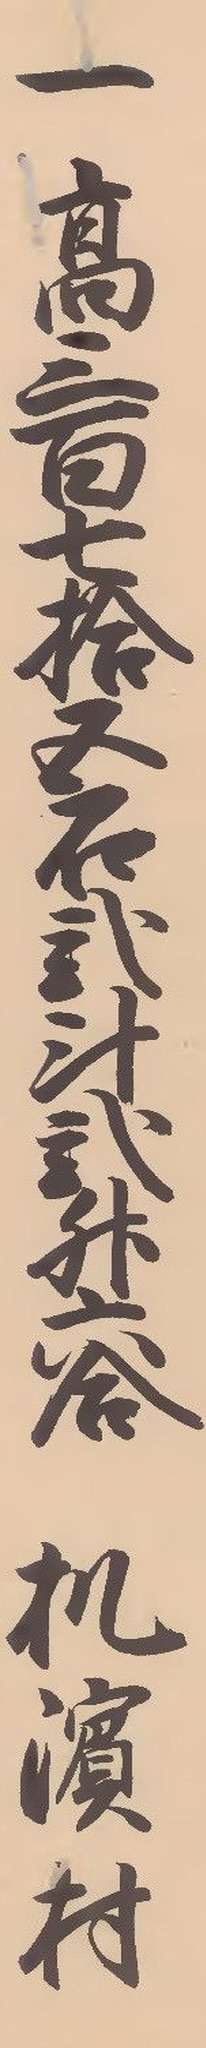一高三百七拾五石弐斗弐升六合机浜村
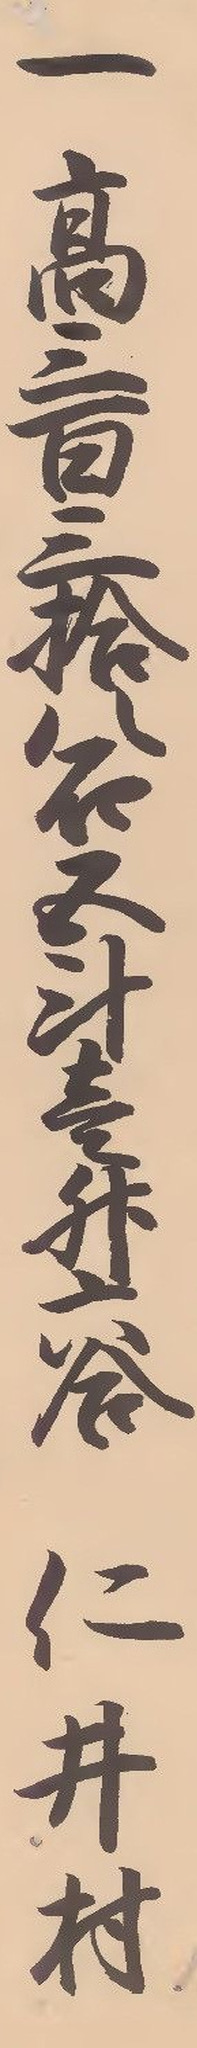一高三百三拾八石五斗壱升六合仁井村

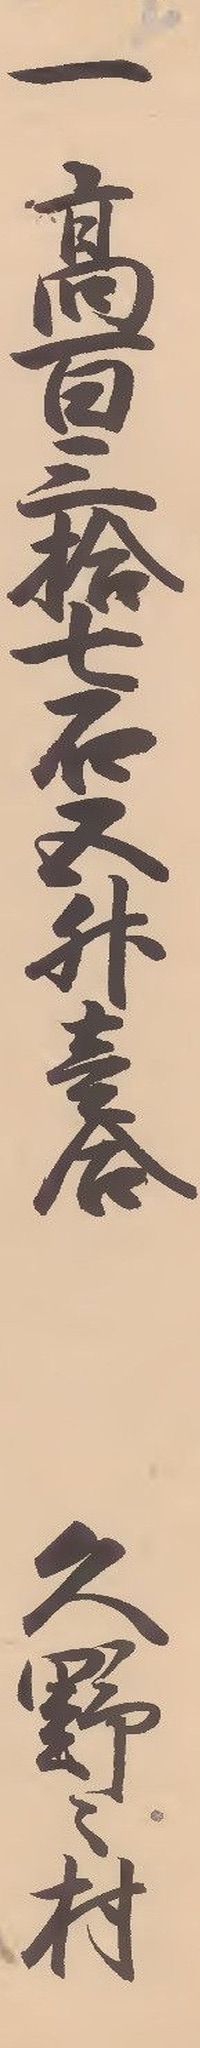一高百三拾七石五升壱合久野々村
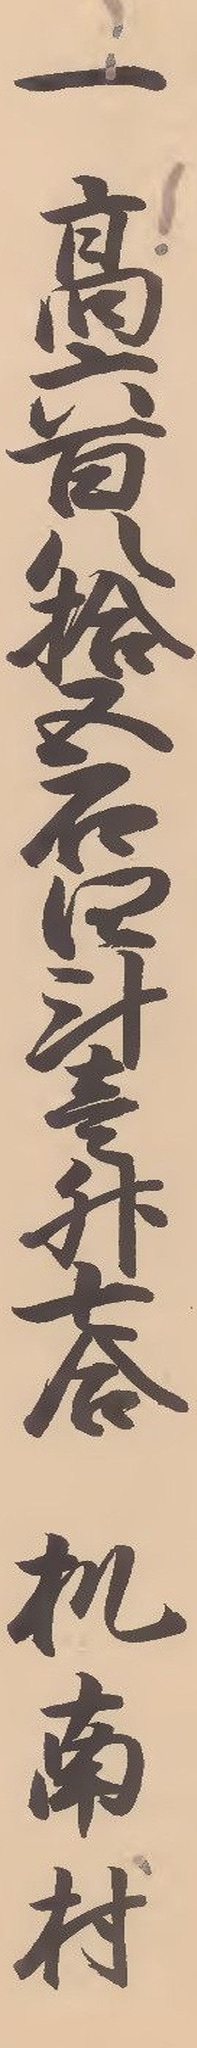一高六百八拾五石四斗壱升七合机南村
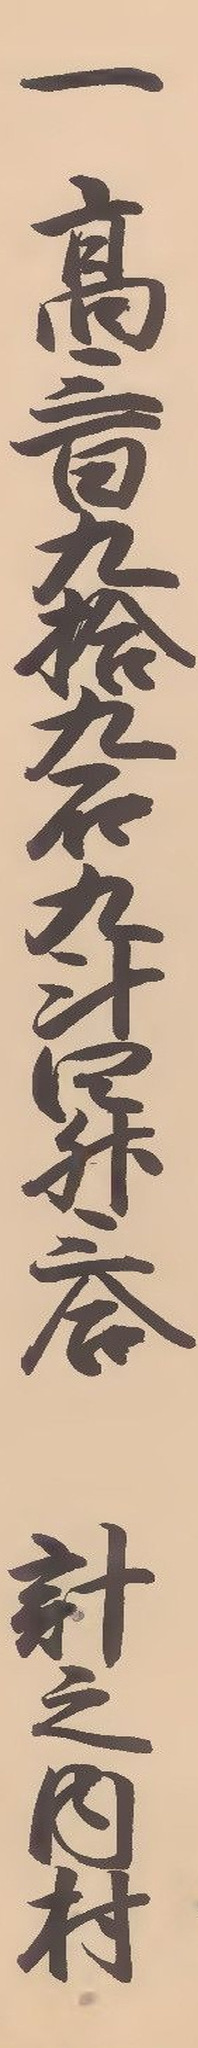一高三百九拾九石九斗四升三合計之内村
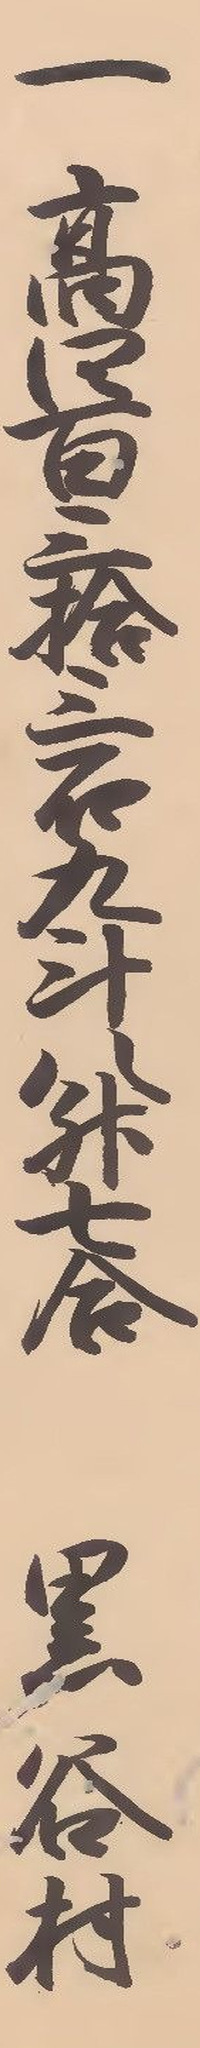一高四百三拾三石九斗八升七合黒谷村
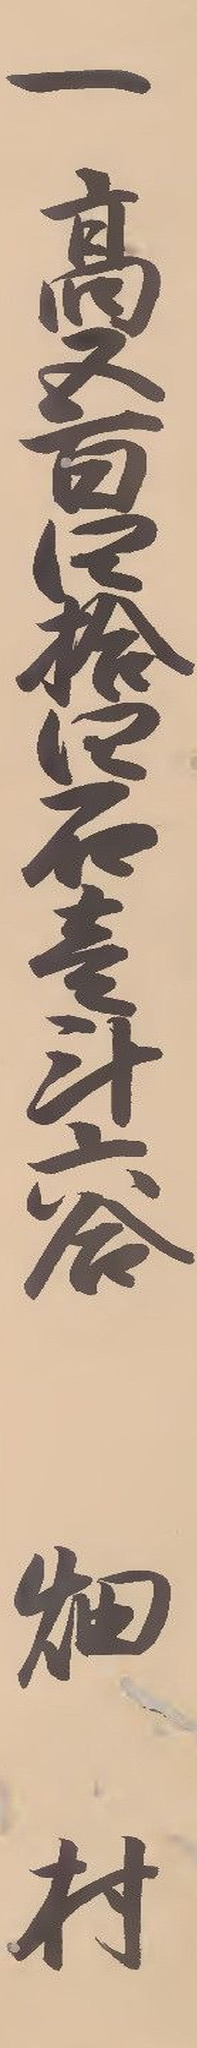一高五百四拾四石壱斗六合畑村
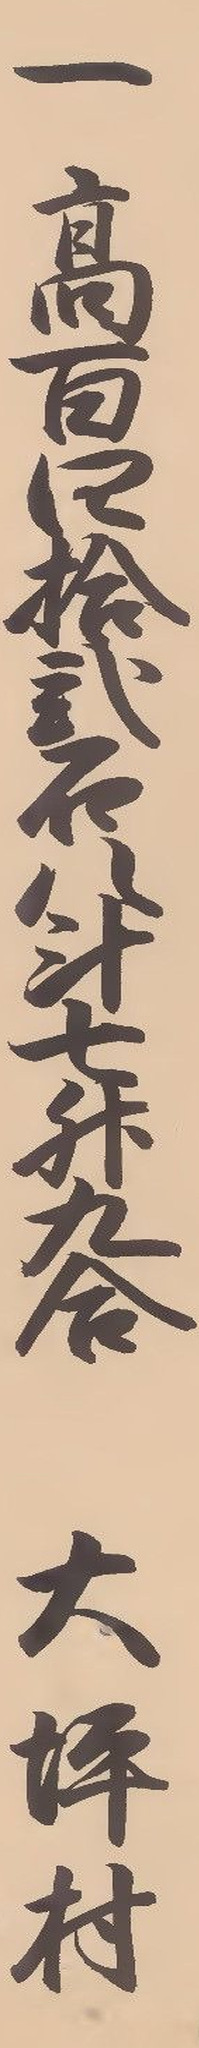一高百四拾弐石八斗七升九合大坪村
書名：淡路国郷帳
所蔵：国立公文書館 National Archives of Japan
